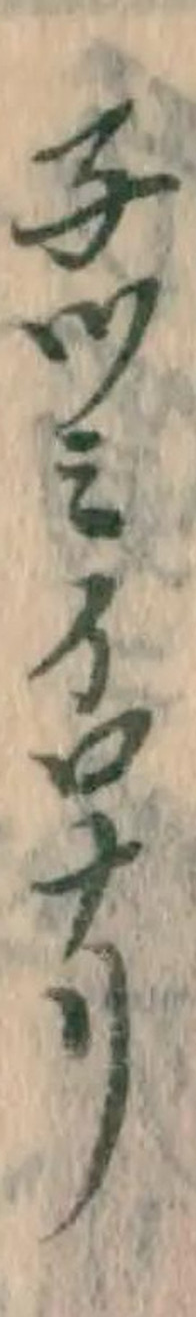ネツミイロナリ
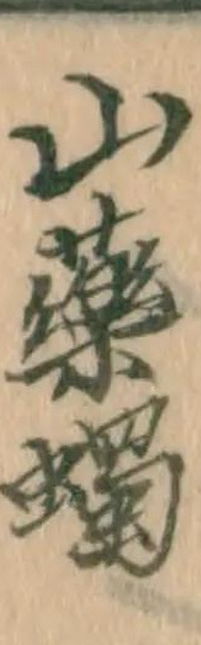山薬蠋
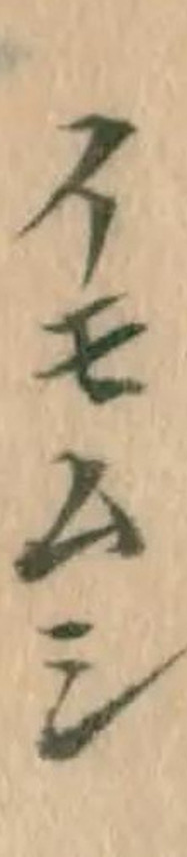イモムシ

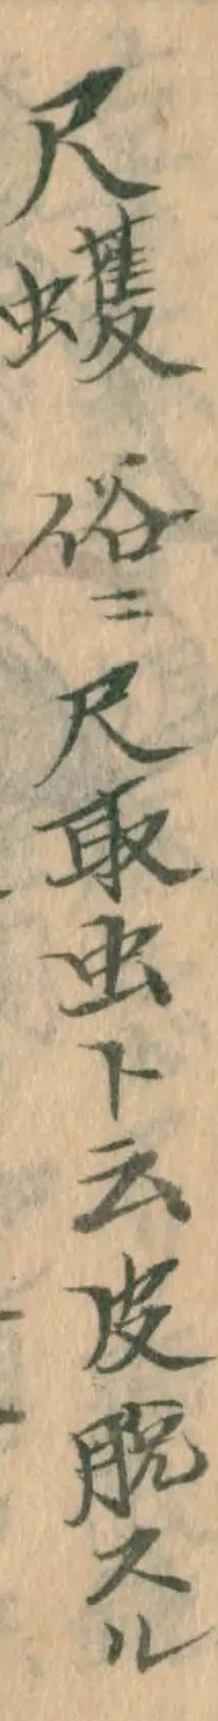尺蠖俗ニ尺取虫ト云皮脱スル
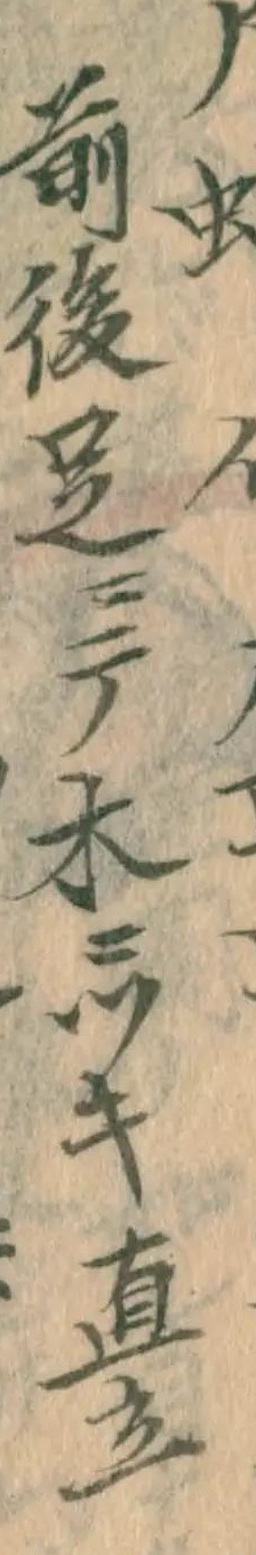前後足ニテ木ニツキ直立
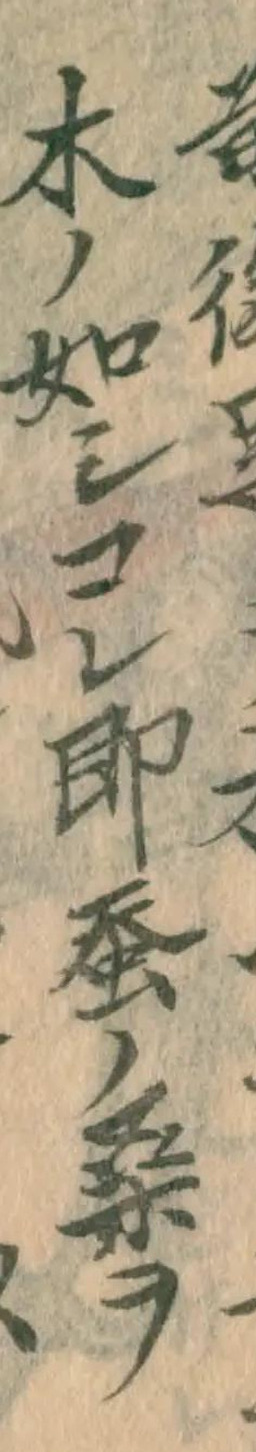木ノ如シコレ即蚕ノ桑ヲ
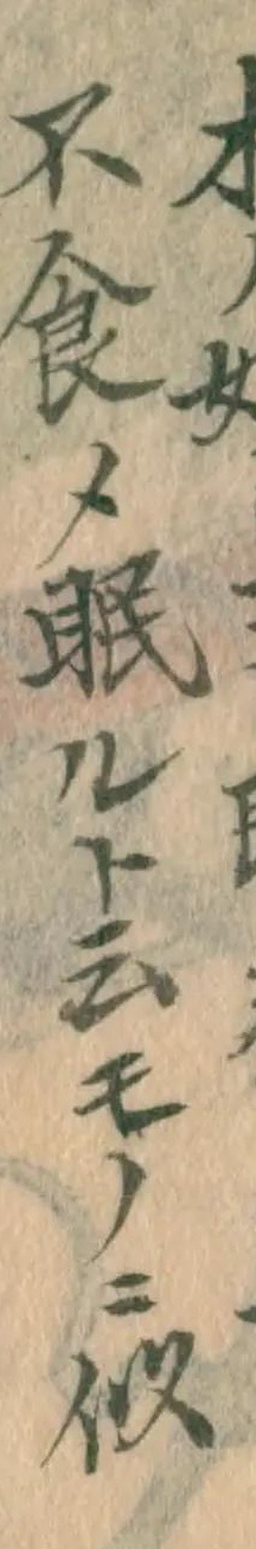不食シテ眠ルト云モノニ似
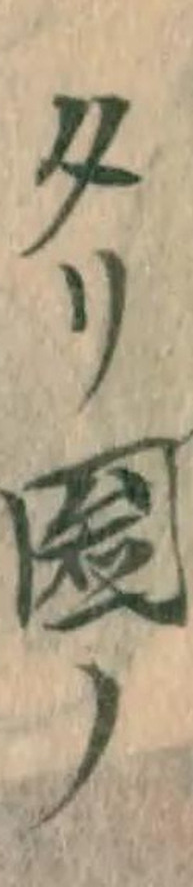タリ圖ノ
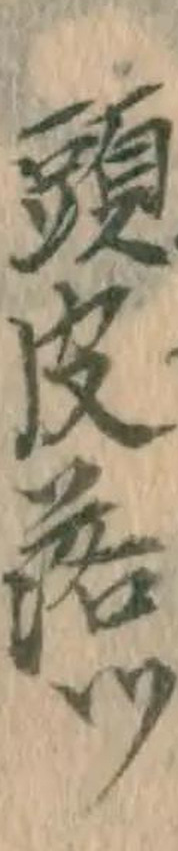頭皮落ツ
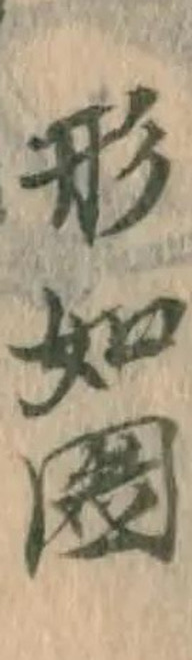形如圖
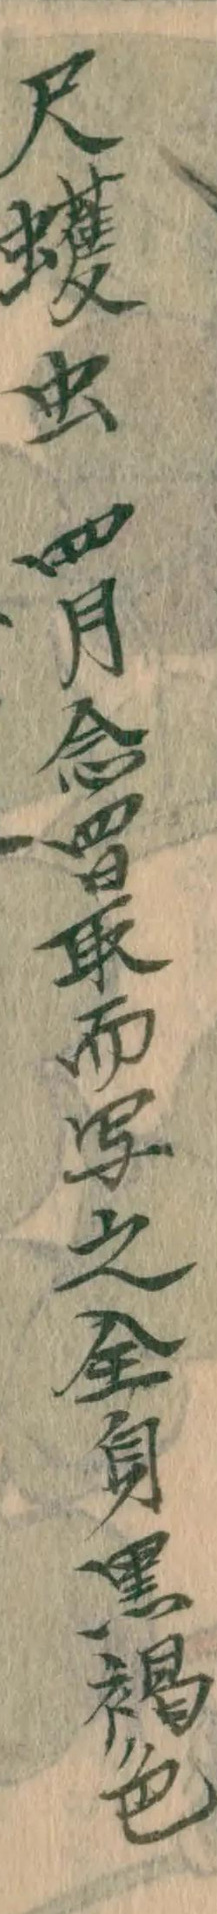尺蠖虫四月念四日取而写之全身黒褐色
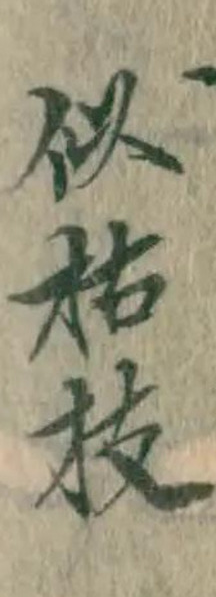似枯枝
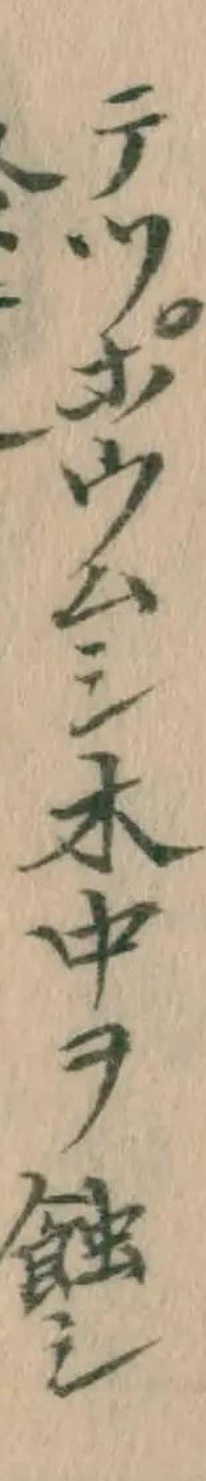テツポウムシ木中ヲ蝕シ
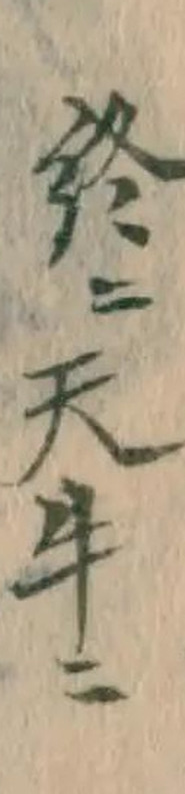終ニ天牛ニ
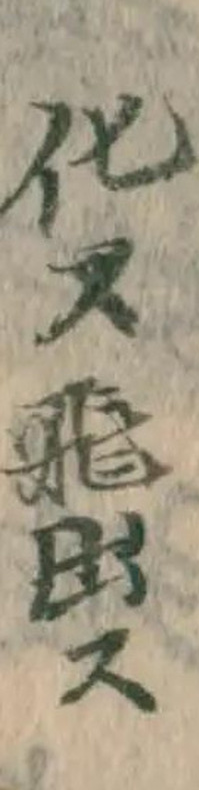化ス飛出ス
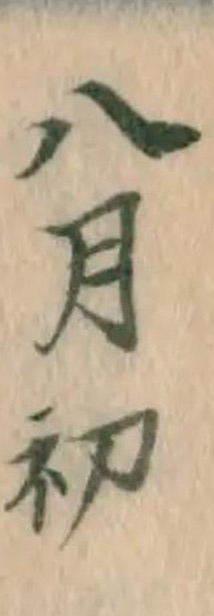八月初
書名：千蟲譜 3巻. [2]
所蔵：国立国会図書館 National Diet Library, JAPAN
